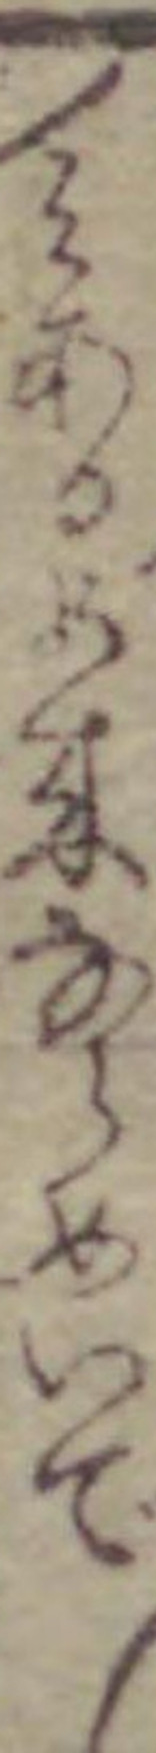みある如来ならめいで
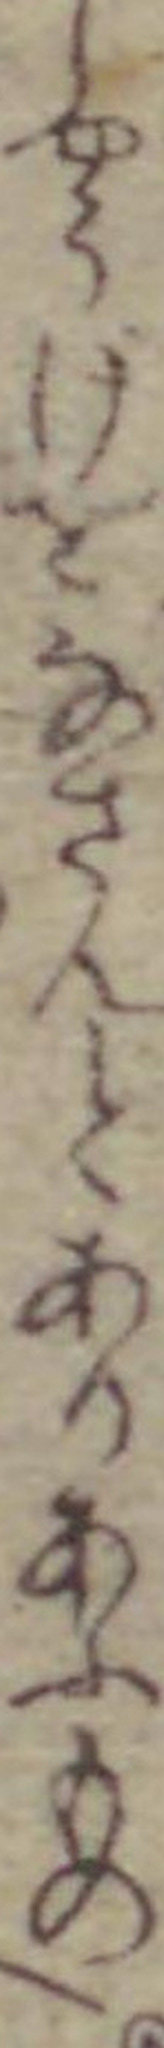しやうけをなさんとありあふもの
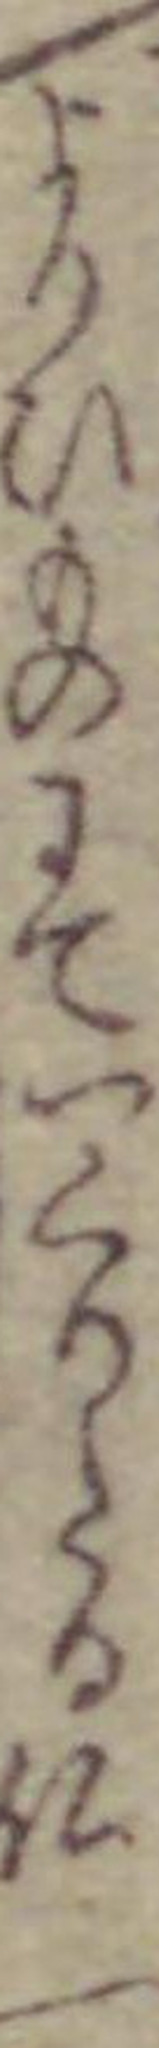よりひものにてつくりたる仏
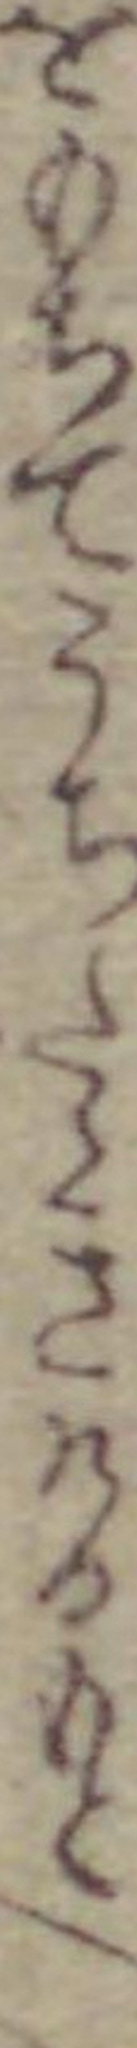をもちてうちたゝきけるもと
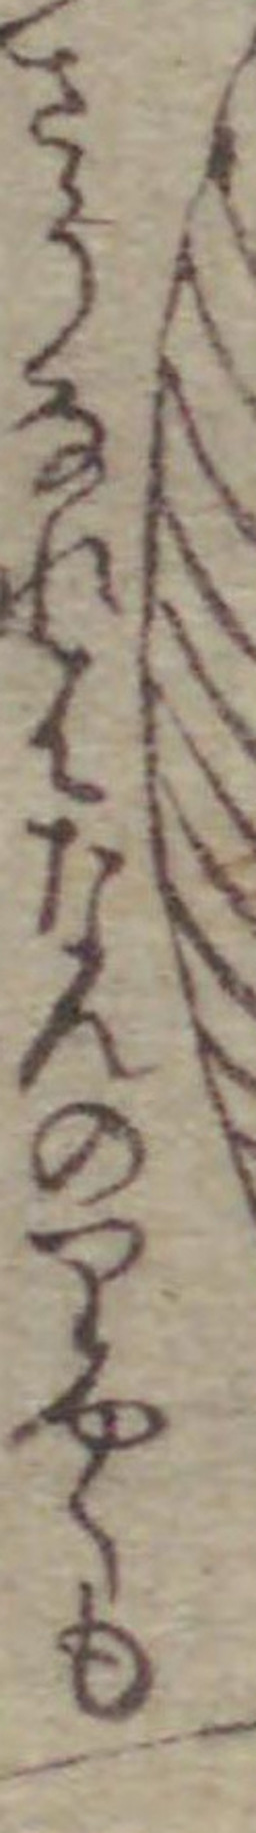さうなれはなんのりやくも
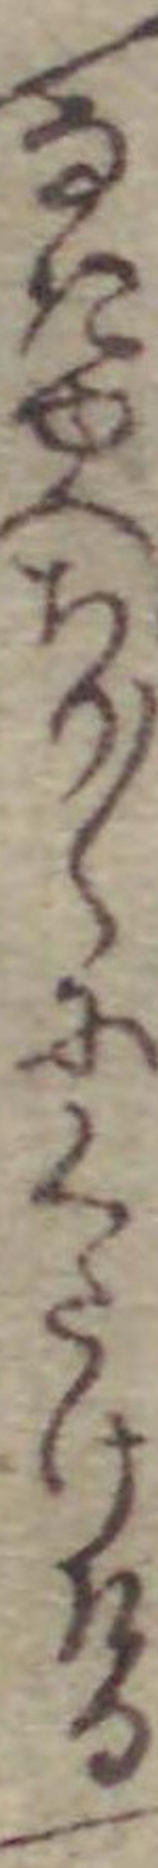なきゆへちり〳〵にくたける
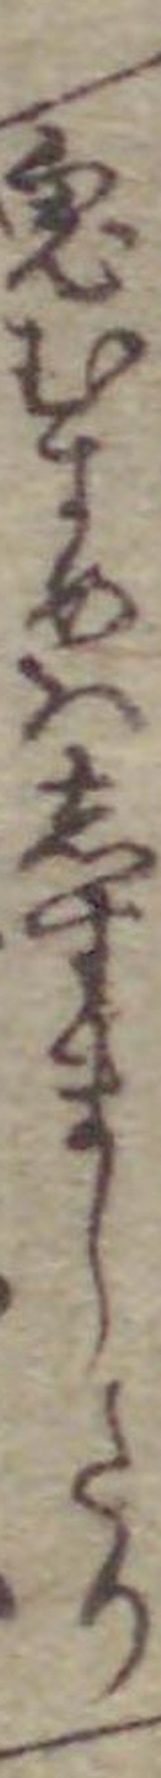鬼むすめはしすましたり
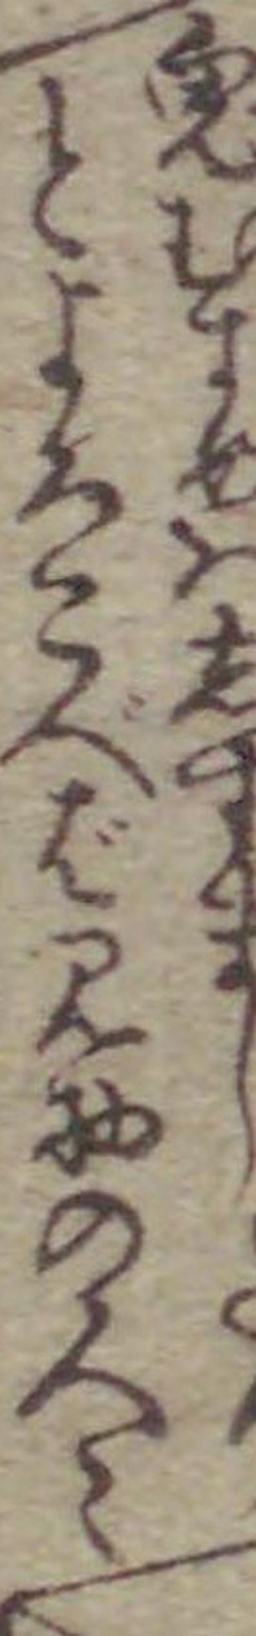とよろこべば見物の人々
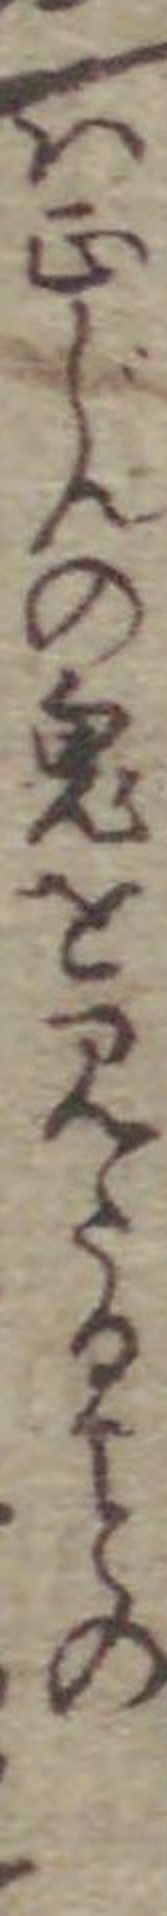は正じんの鬼を見たることの
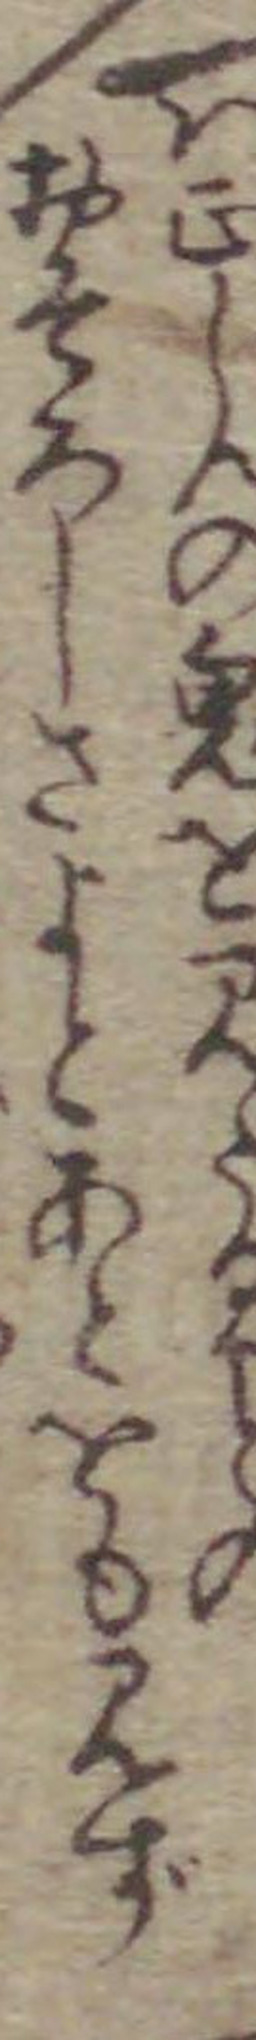おそろしさよとあとをも見ず
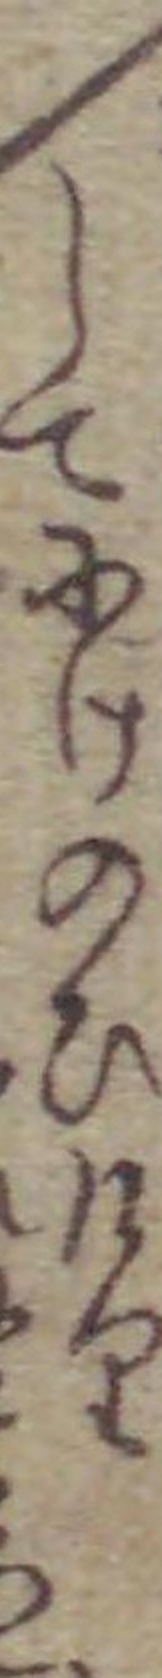してにけのひけり
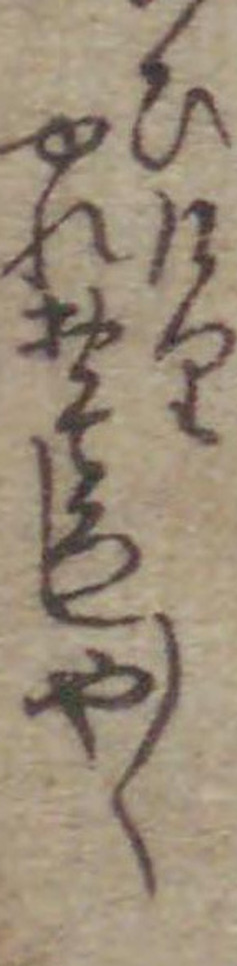やれおそろしや〳〵

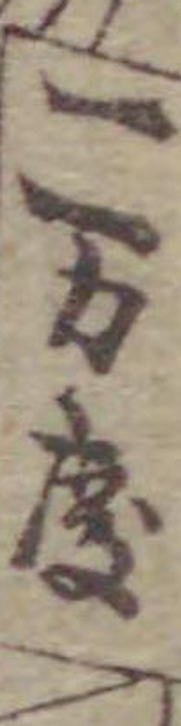一万度
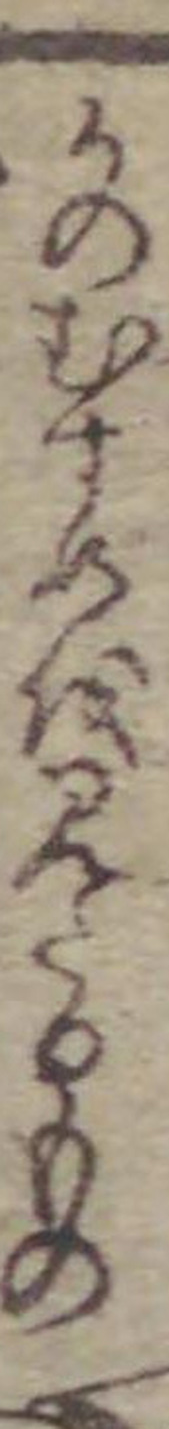かのむすめを見たるもの
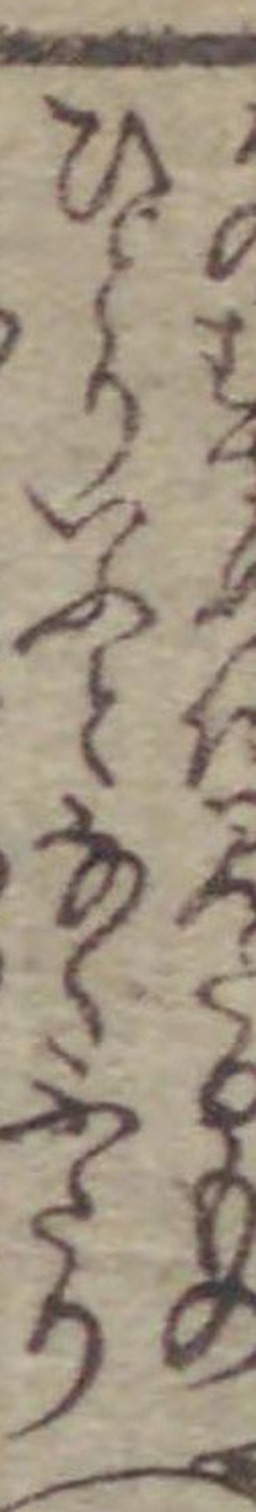ひとりいふとなくふたり
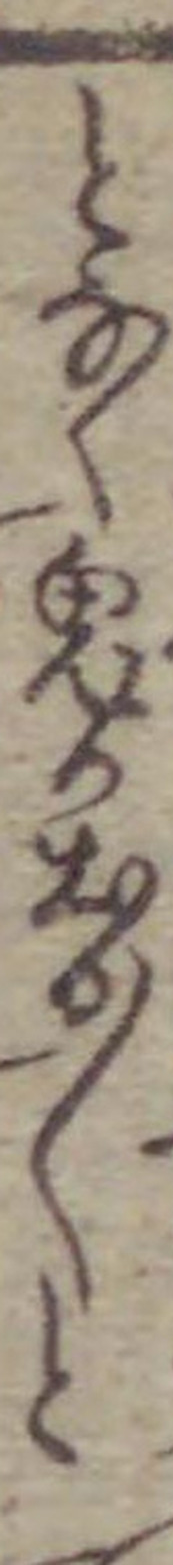となく鬼か出る〳〵と
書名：鬼の趣向草 2巻
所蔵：国立国会図書館 National Diet Library, JAPAN
